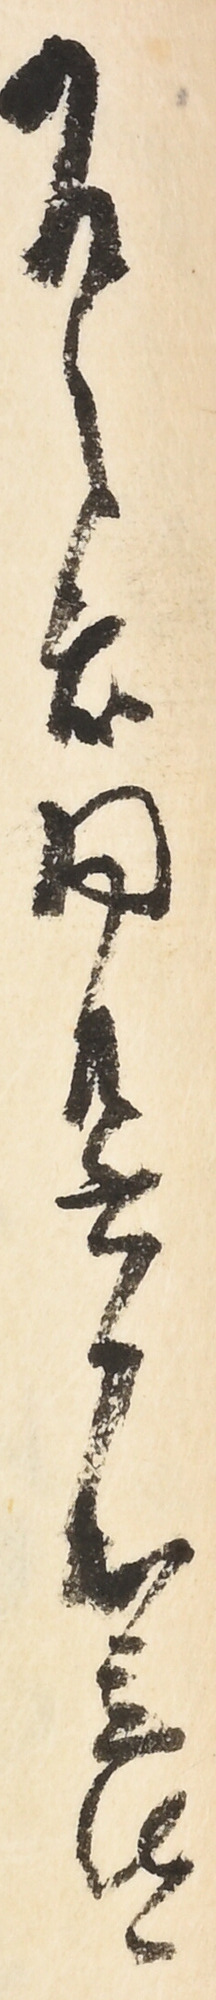右之者同廿六日出立仕候

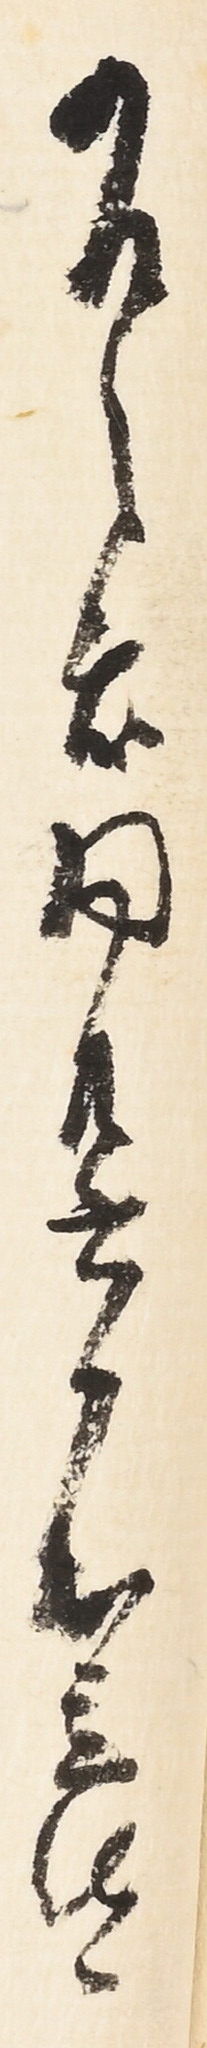右之者同廿六日出立仕候
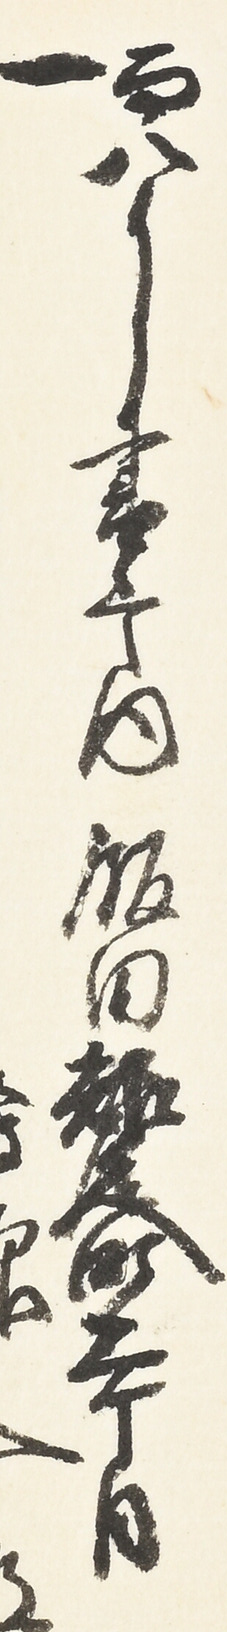酉八月書上之内飯田知久町二丁目
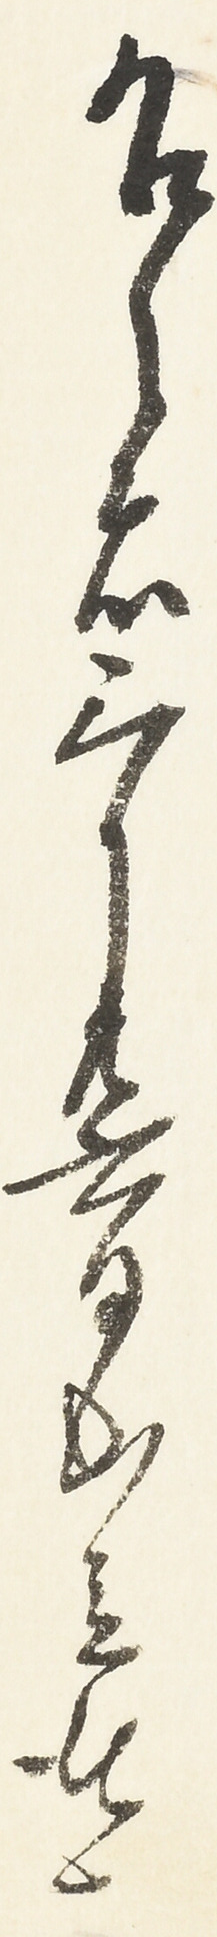右之者三月廿六日出立仕候
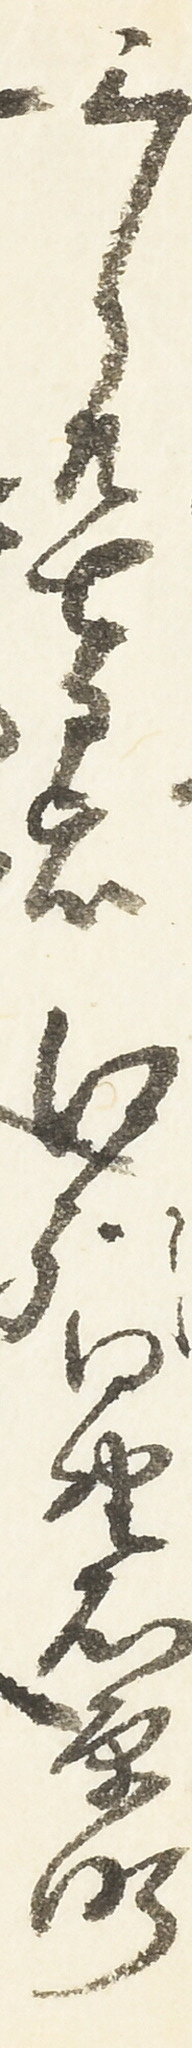三月廿七日着江州日野石原町
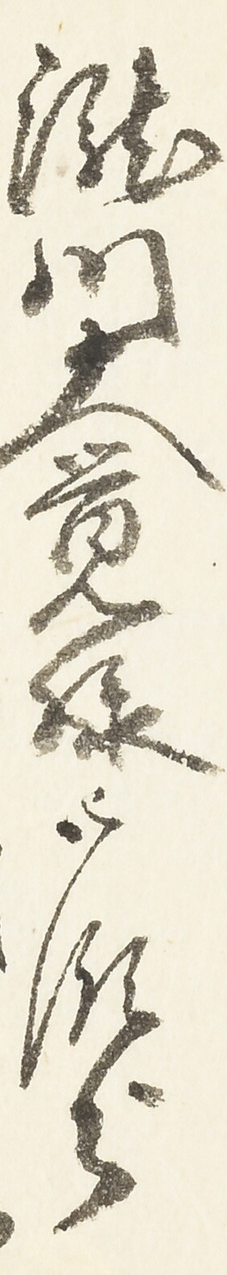瀧川大覚様御領分
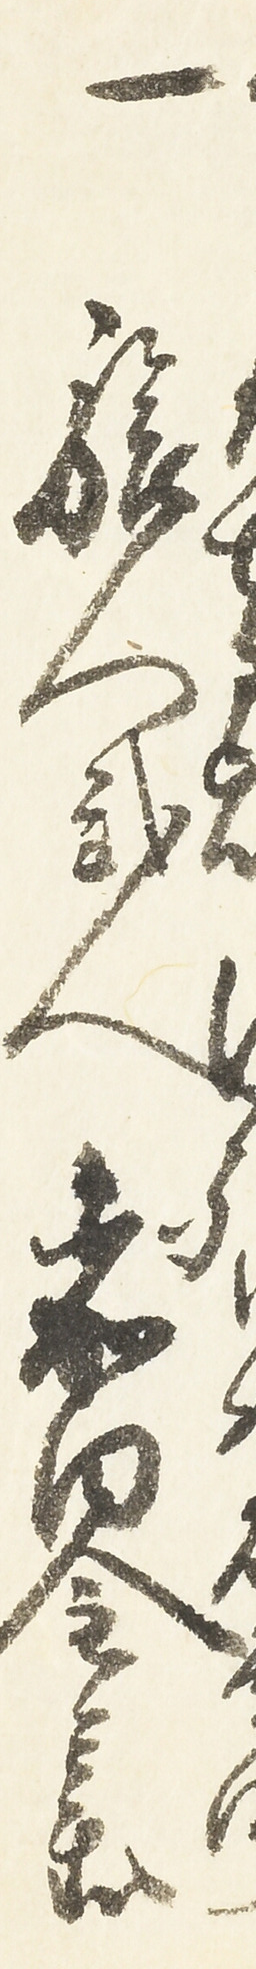一旅人弐人森田金兵衛
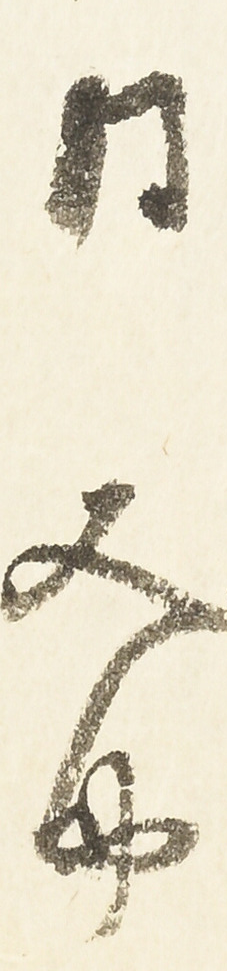同又助
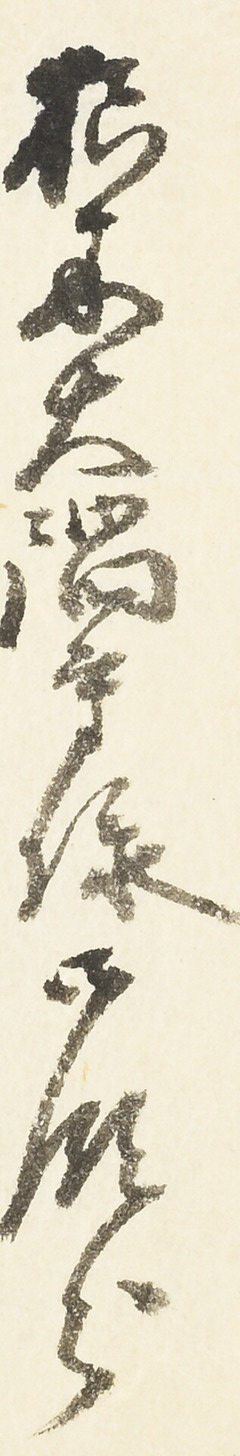朽木大隅守様御領分
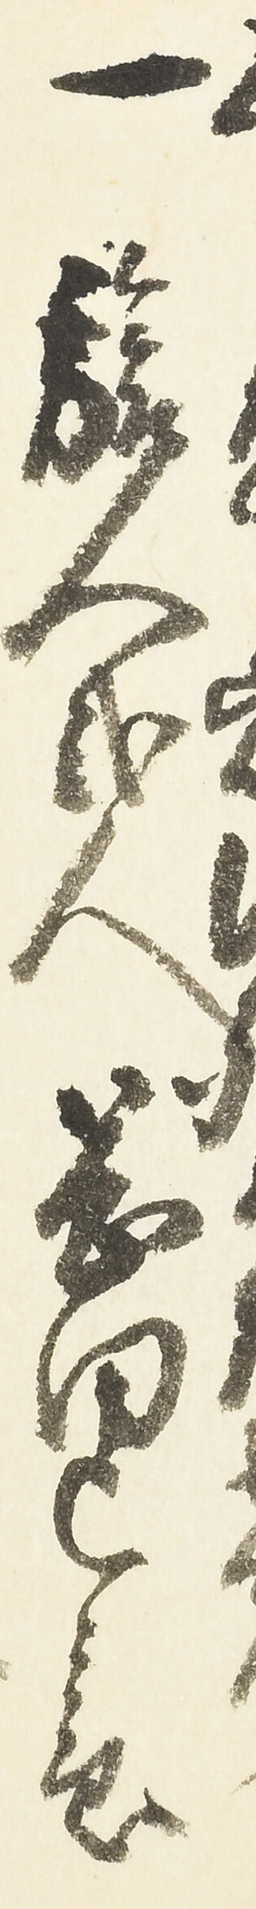一旅人弐人岡田与兵衛
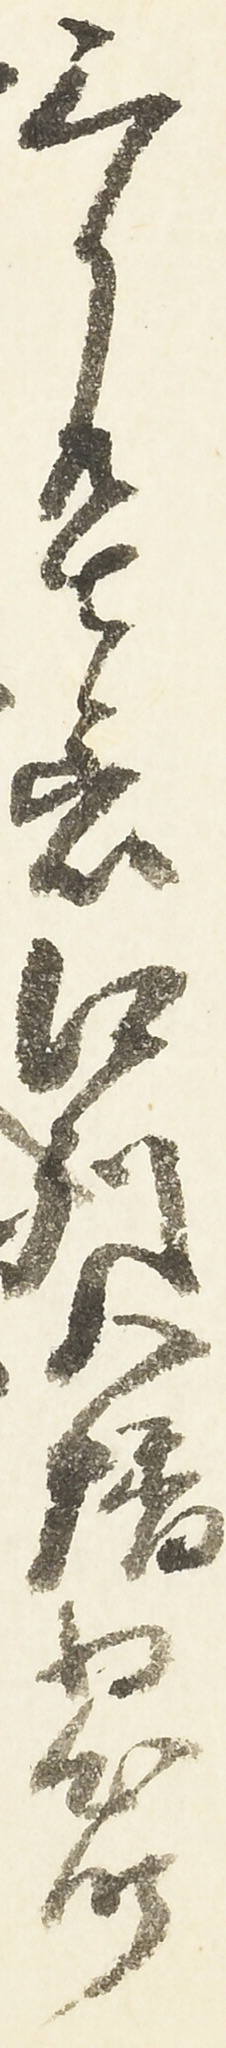三月廿七日着江州八幡為心町
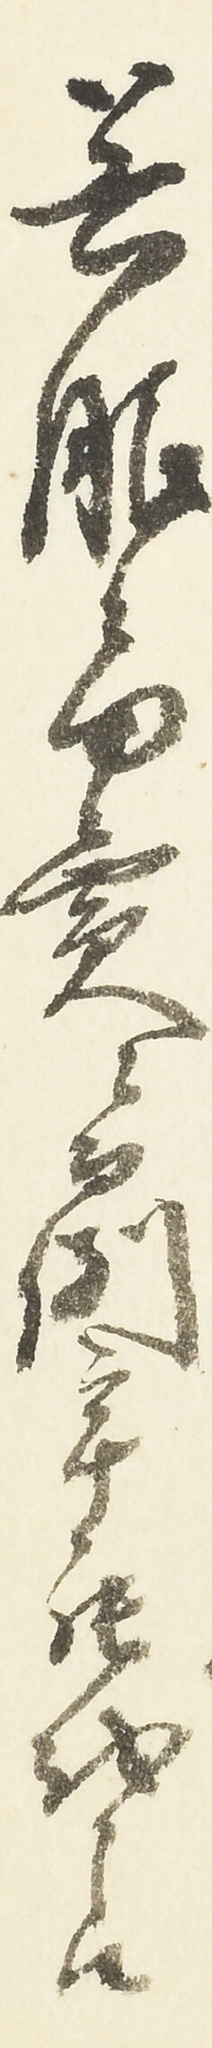呉服商売ニ而例年罷越申候
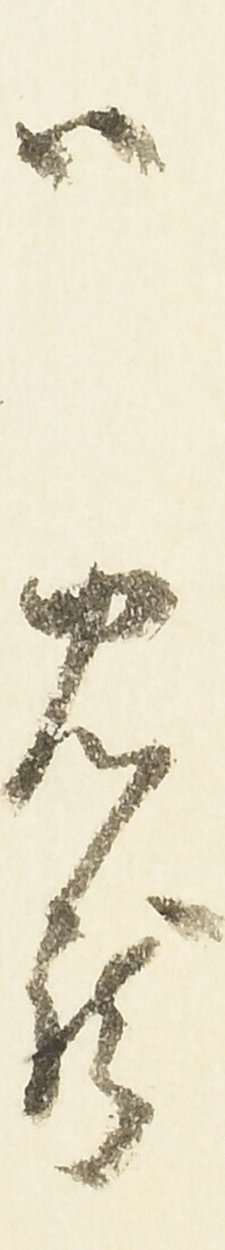同忠蔵
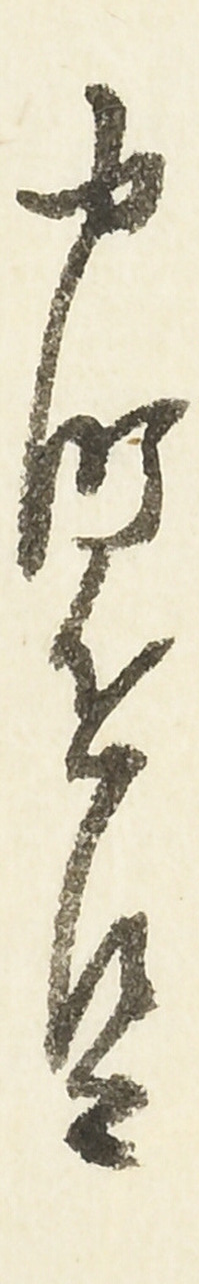中町近江屋
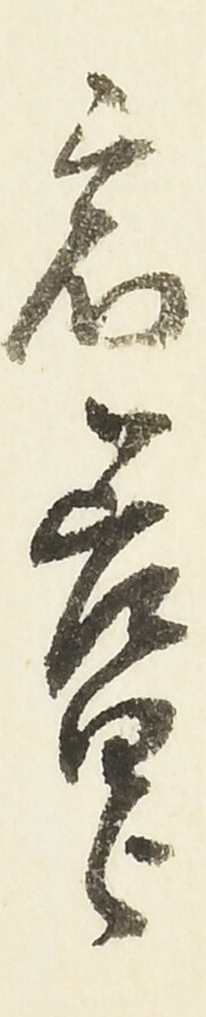宿善四郎

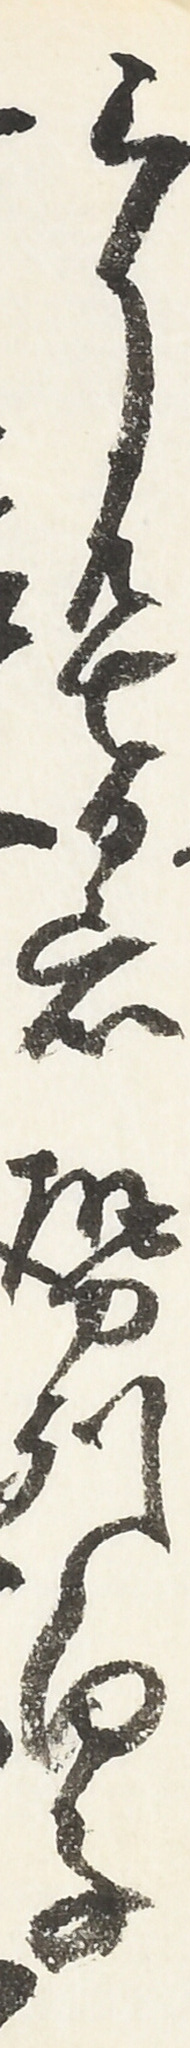三月廿七日着勢州白子
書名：町中旅人泊控帳
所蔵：伊那市立高遠町図書館・合同会社AMANE
